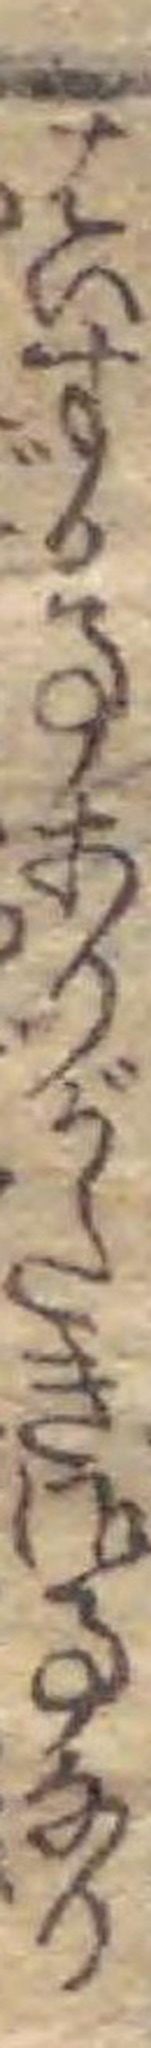はいする事ありがたき御事なり
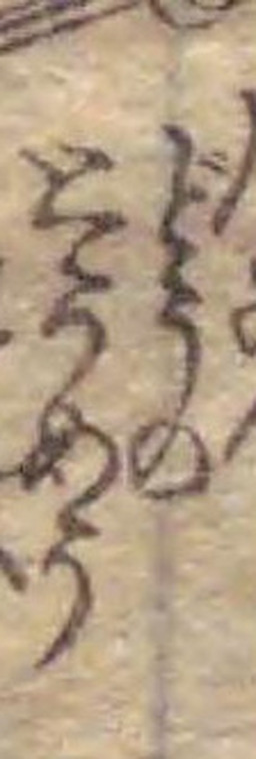とうめう
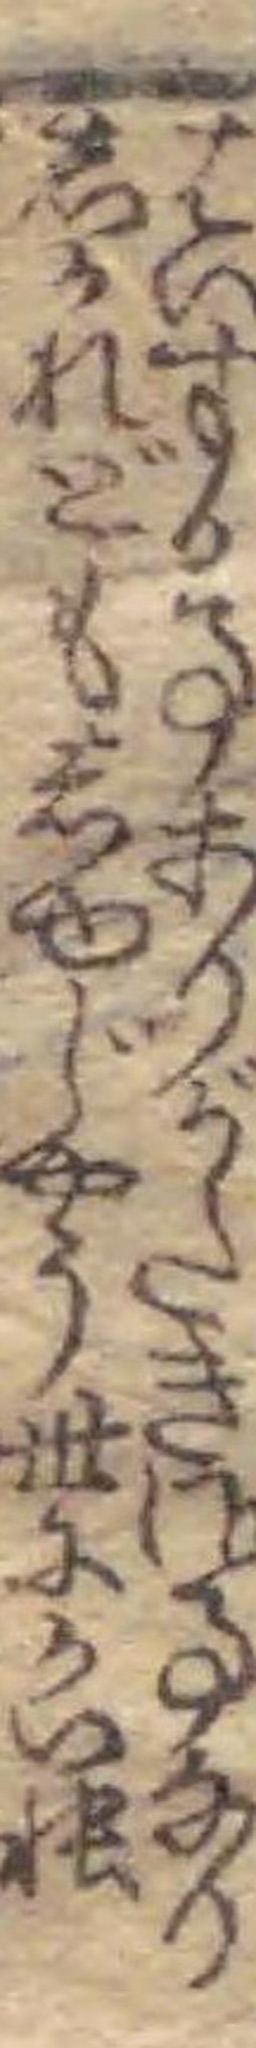しかれどもしゆじやう世にかい帳
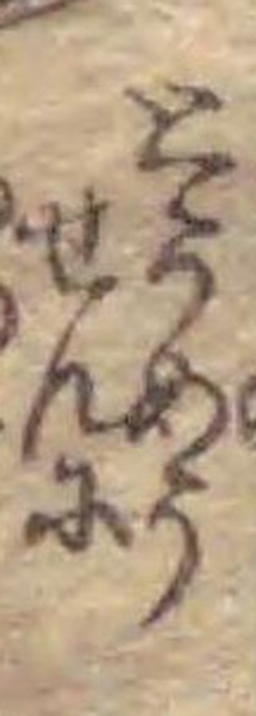せんに
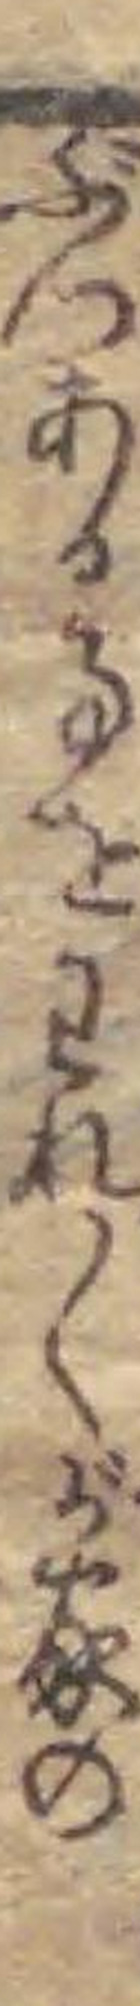ぶつある事をわれ〳〵が家の
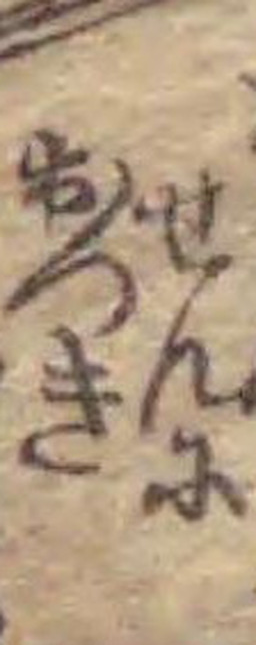おつき
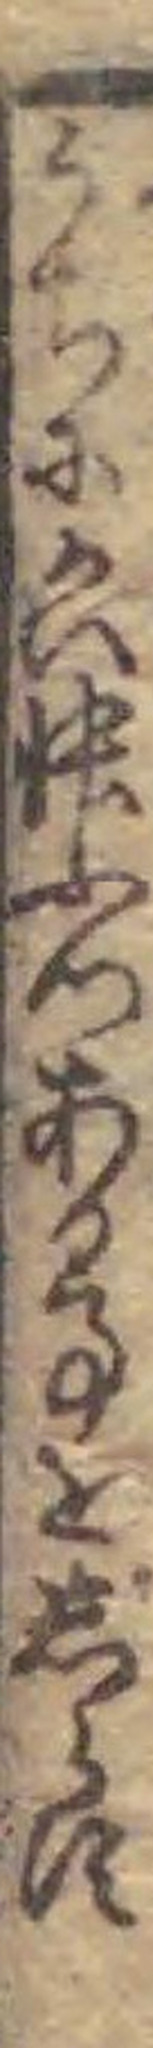うちにかい帳ふつある事をしらす
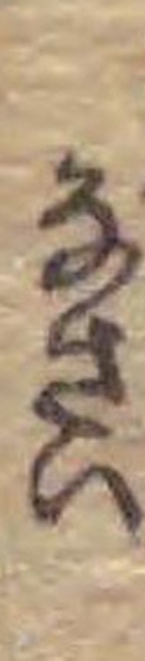なさい
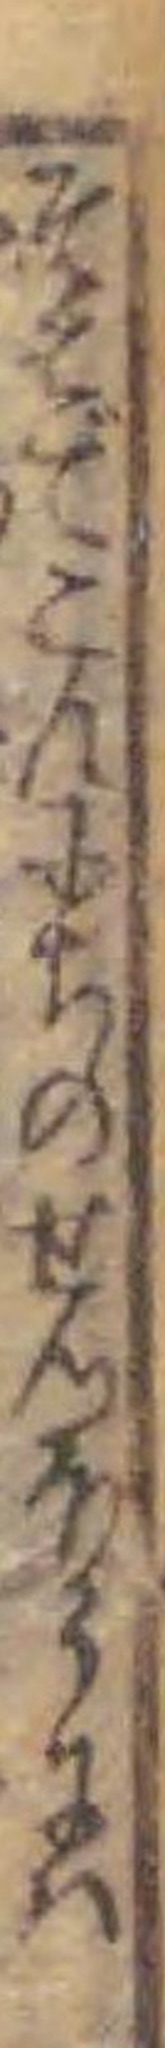そこでこんにちのせつほうには
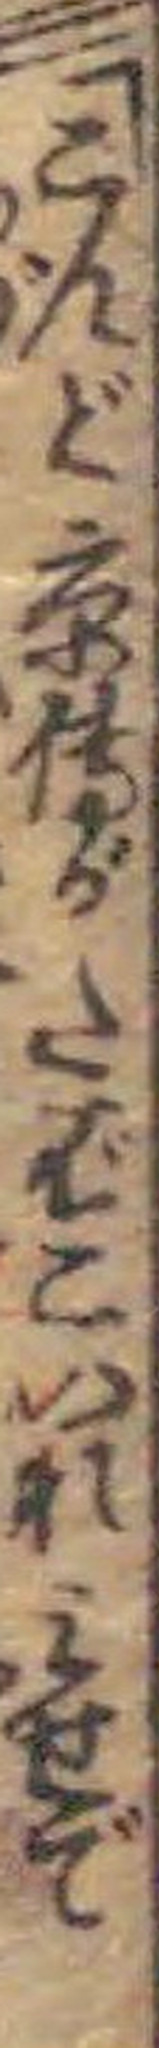〽こんど京伝がたばこいれみせで
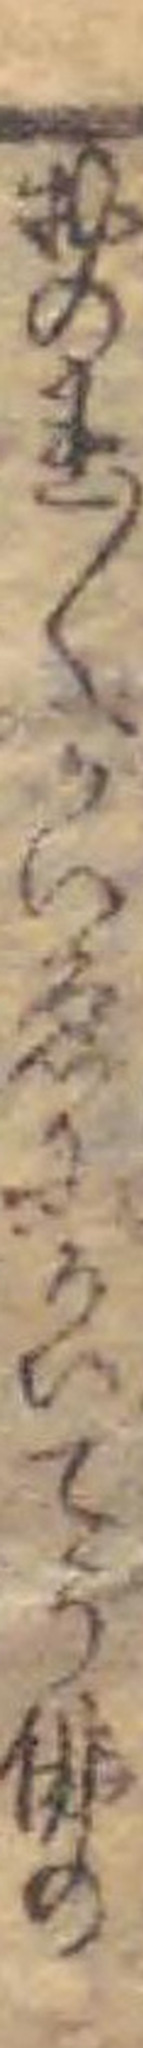おのれ〳〵かいゑにかいてう仏の
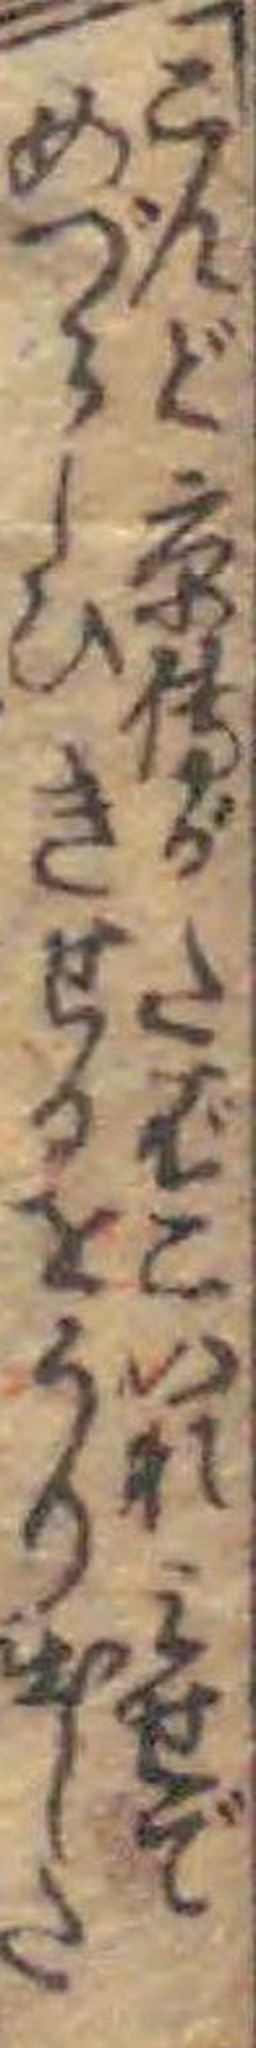めづらしひひせるをうり出したと
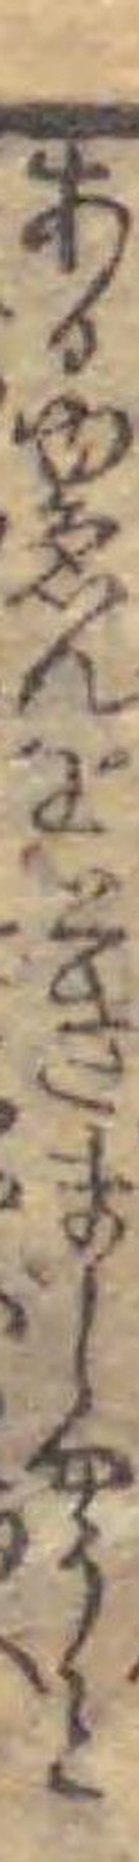あるゆゑんをときましやうと
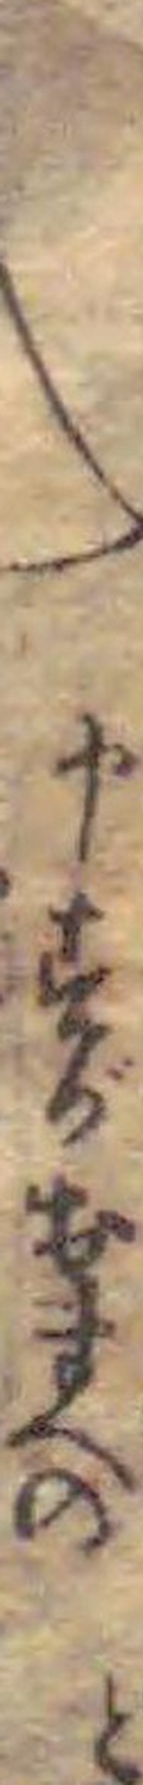申すがおまへの
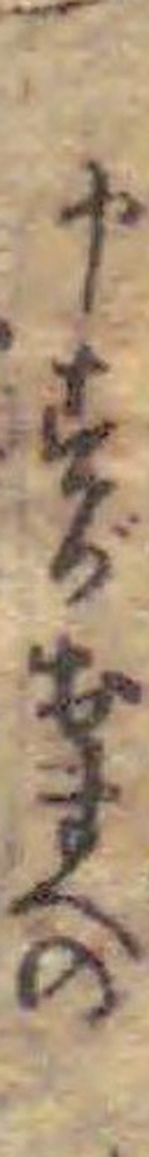申すがおまへの
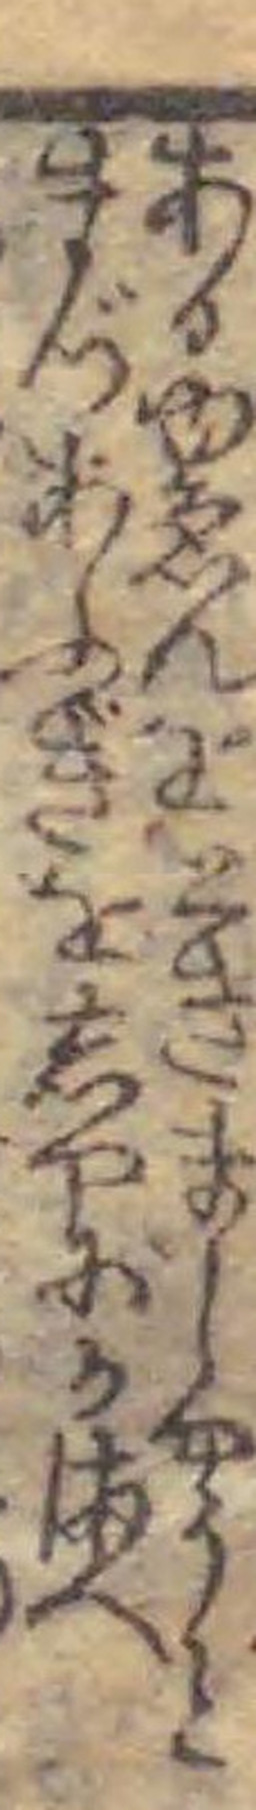まづあふぎをしやにかまへ
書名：身体開帳略縁起 : 3巻
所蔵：国立国会図書館 National Diet Library, JAPAN
